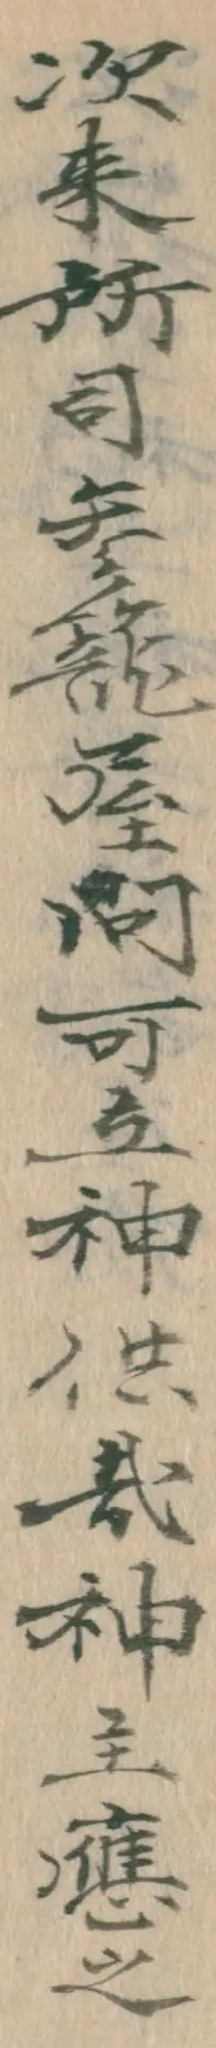次来所司参籠屋問可立神供哉神主応之
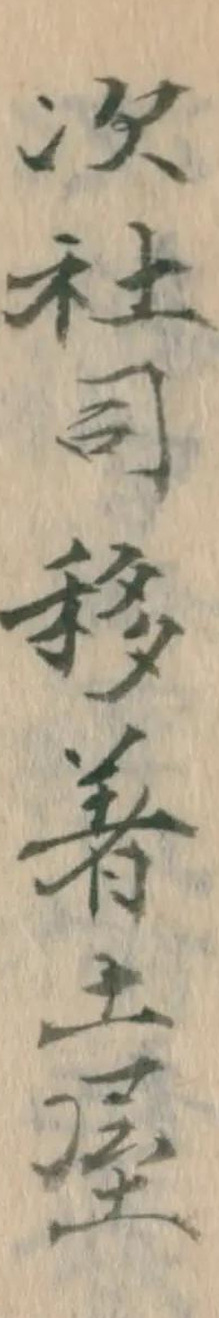次社司移着土屋
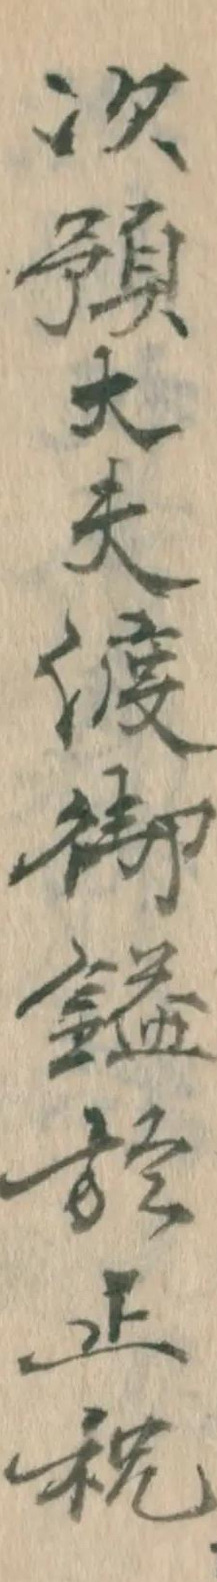次預大夫渡御鎰於正祝
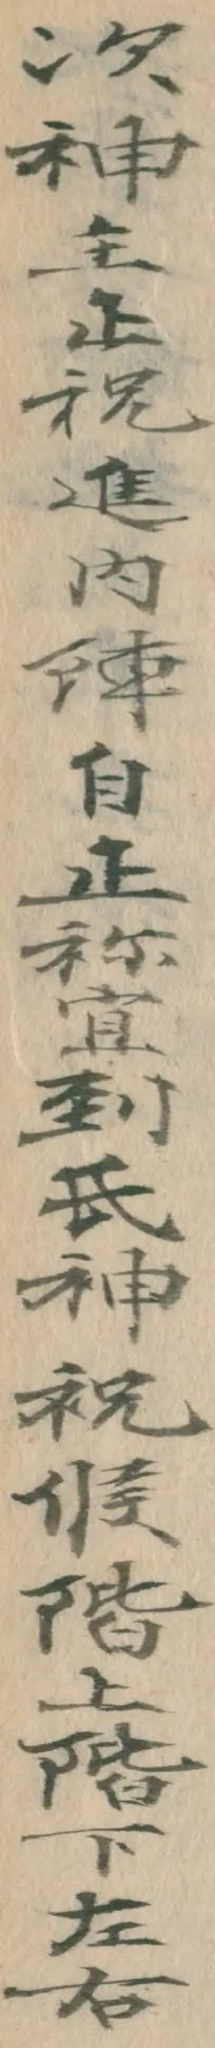次神主正祝進内陣自正祢宜到氏神祝候階上階下左右

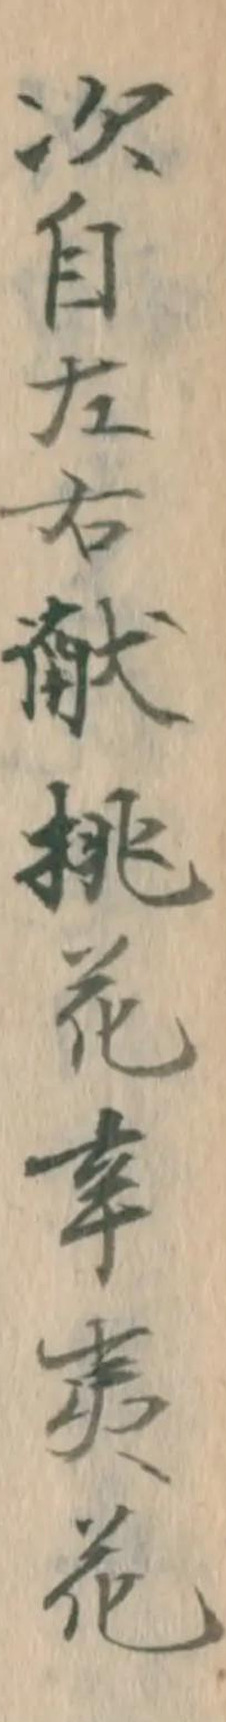次自左右献桃花辛夷花
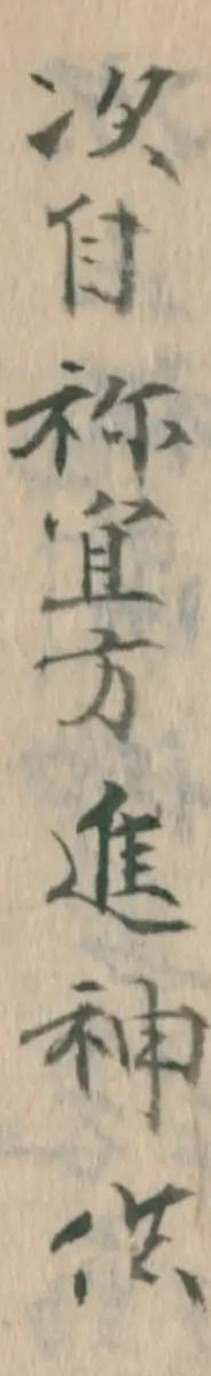次自祢宜方進神供
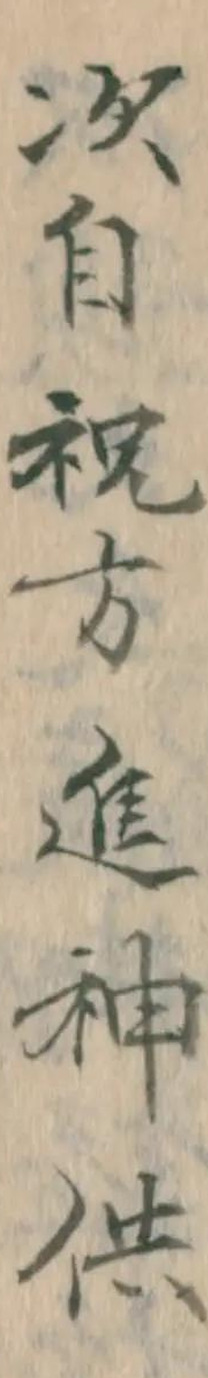次自祝方進神供
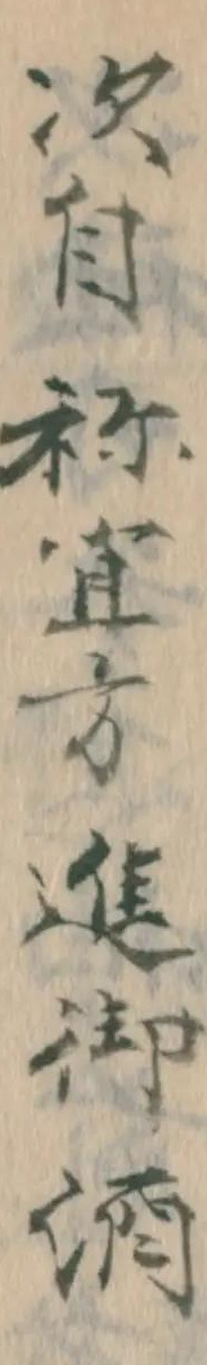次自祢宜方進御酒
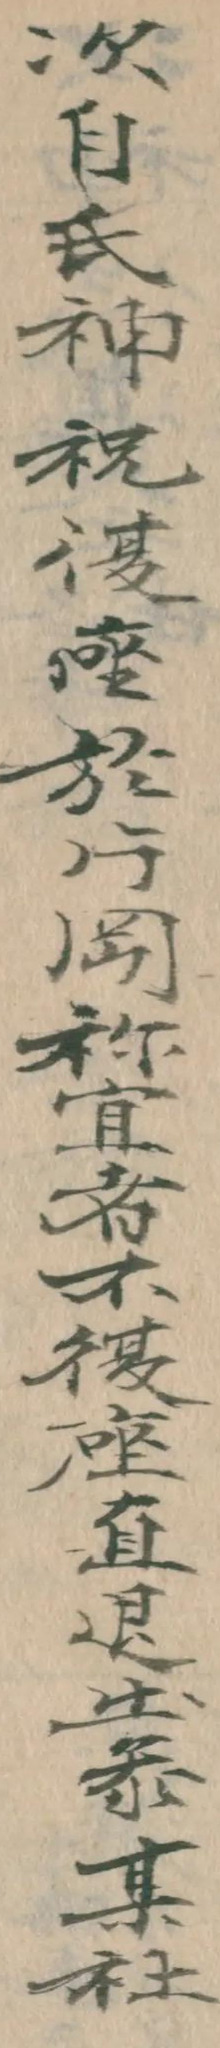次自氏神祝復座於片岡祢宜者不復座直退出参某社
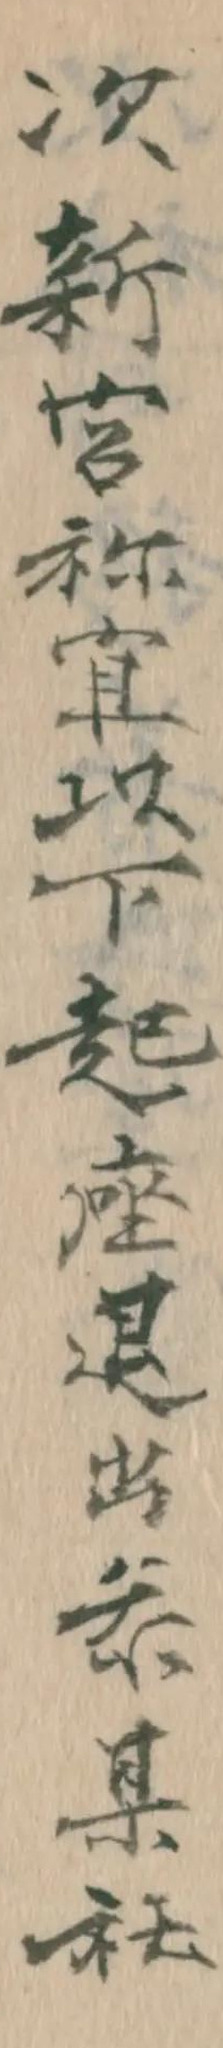次新宮祢宜以下起座退出参某社
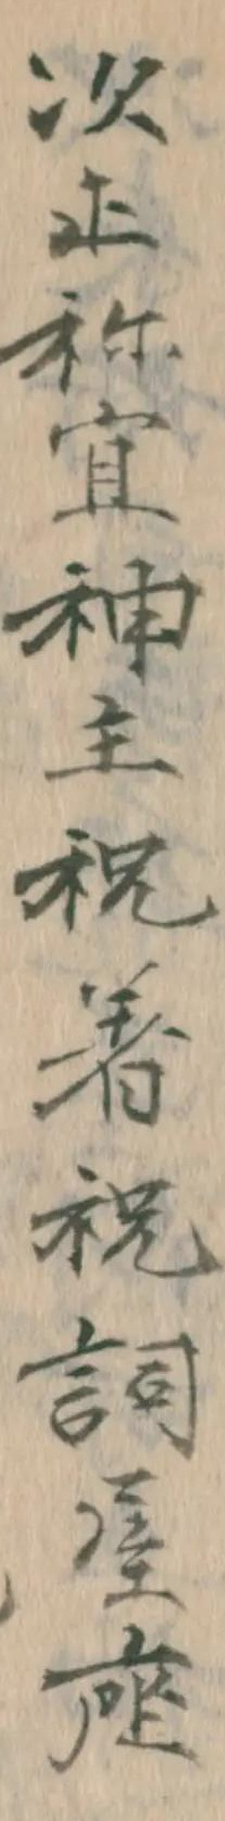次正祢宜神主祝着祝詞屋座
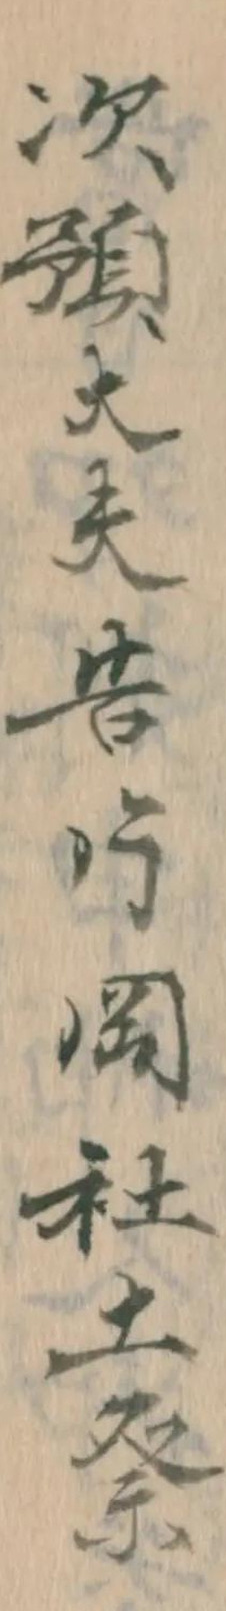次預大夫告片岡社土祭
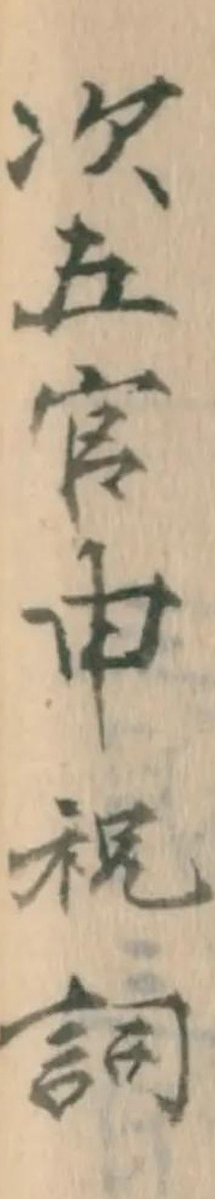欠五官申祝詞
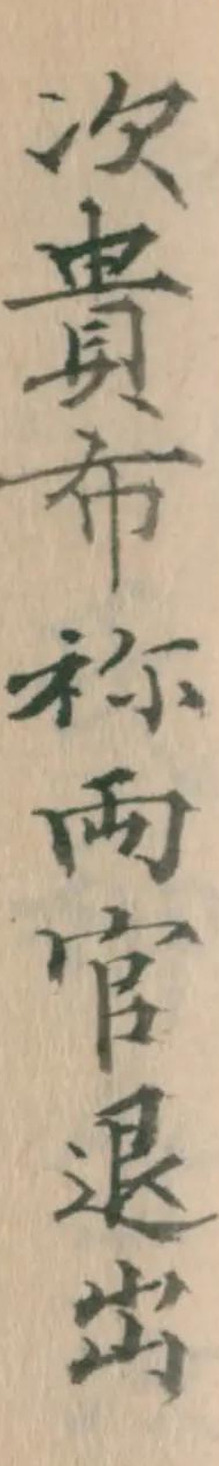次貴ふね両官退出
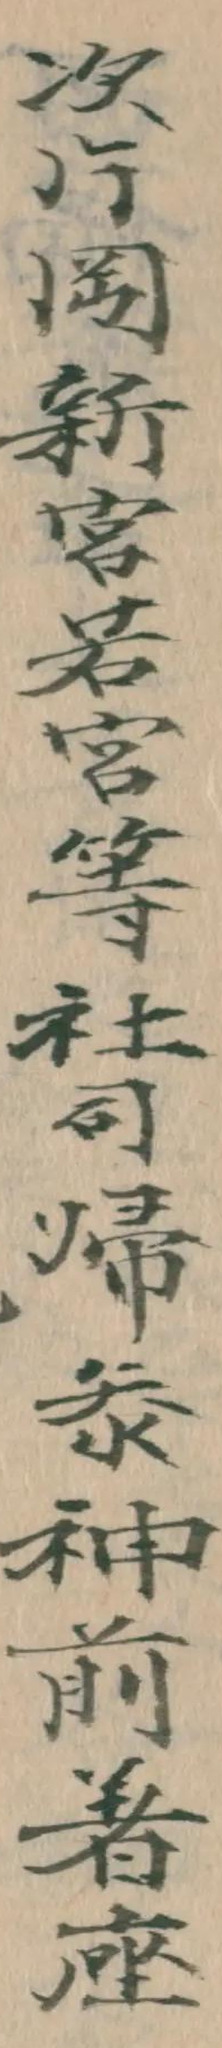次片岡新宮若宮等社司帰参神前着座
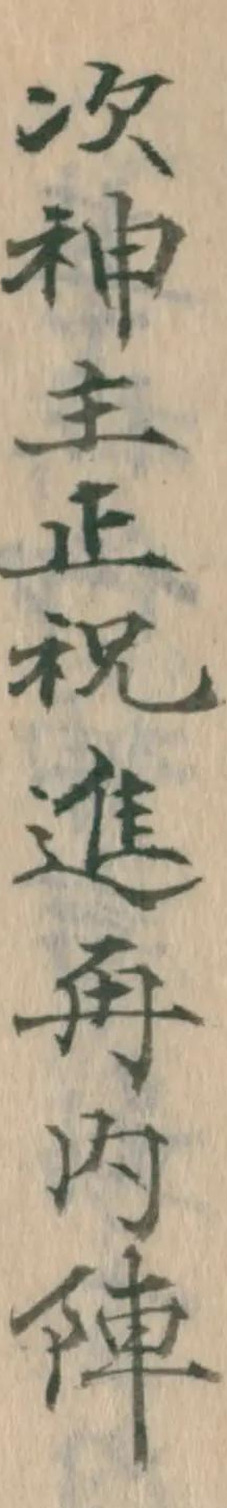次神主正祝進再内陣
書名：賀茂社記録. 第9冊
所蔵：国立国会図書館 National Diet Library, JAPAN
